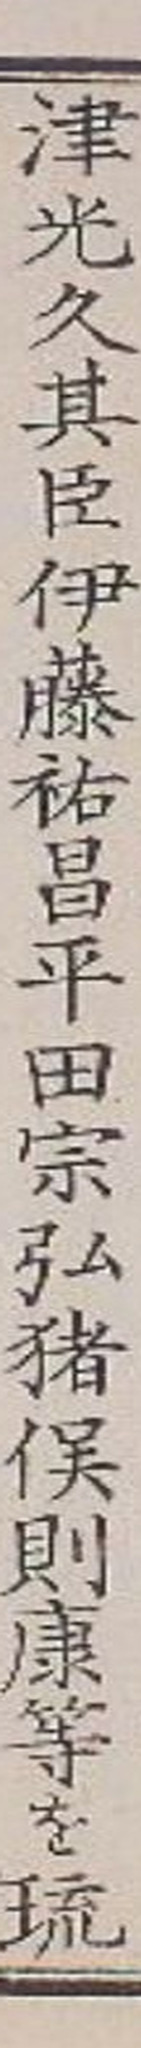津光久其臣伊藤祐昌平田宗弘猪俣則康等を琉
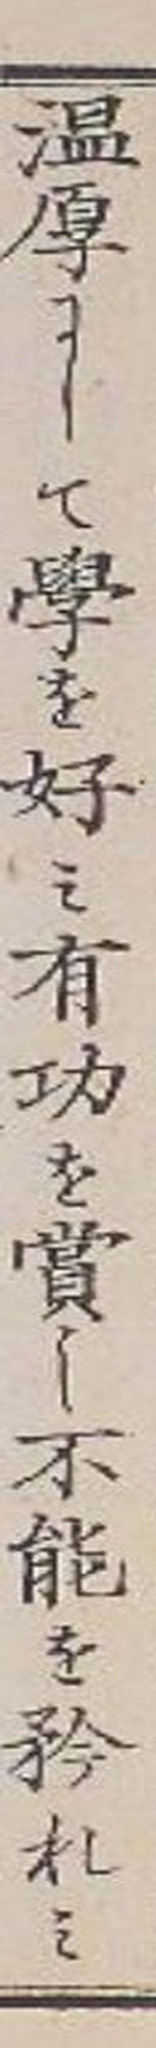温厚にして学を好み有功を賞し不能を矜れみ
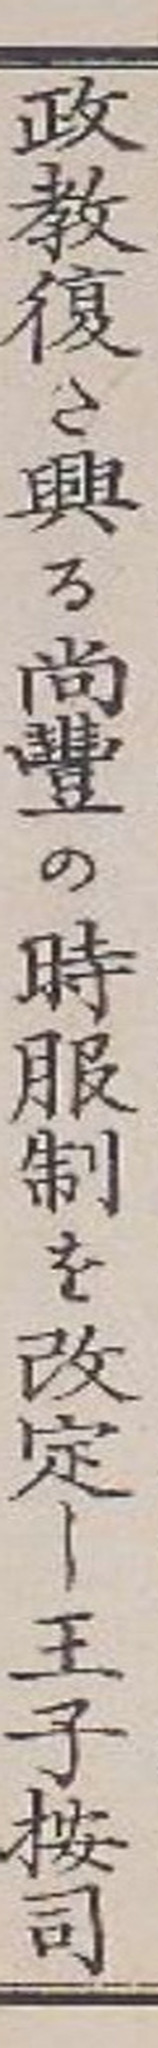政教復た興る尚豊の時服制を改定し王子按司
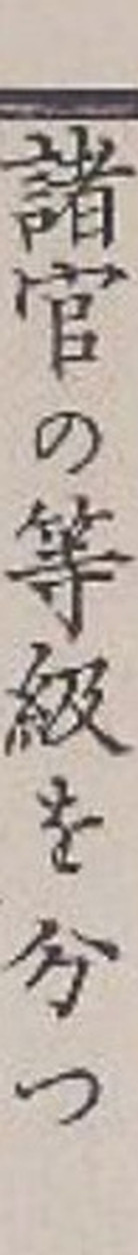諸官の等級を分つ
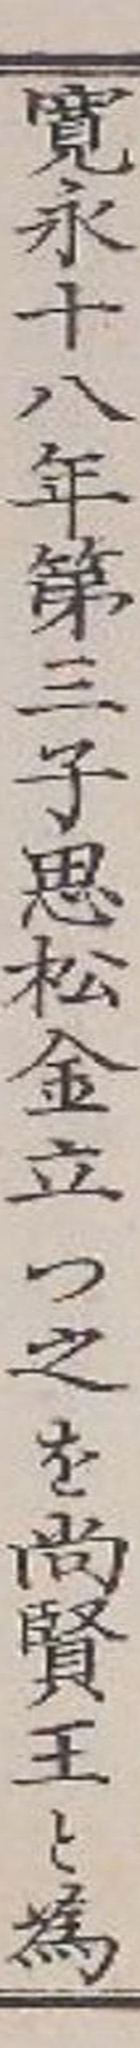寛永十八年第三子思松金立つ之を尚賢王と為
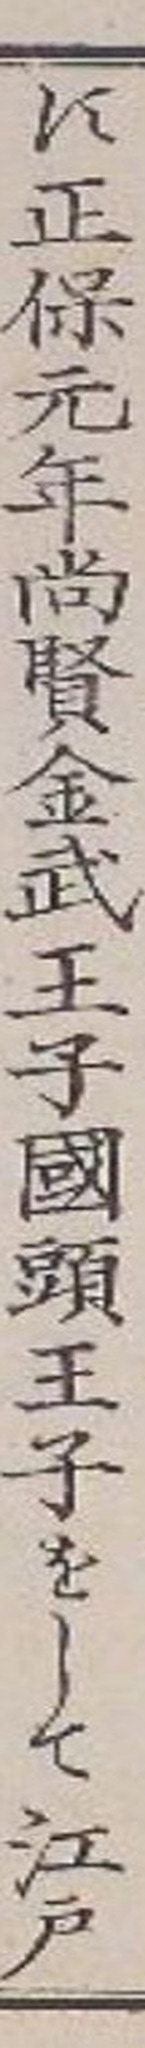す正保元年尚賢金武王子国頭王子をして江戸
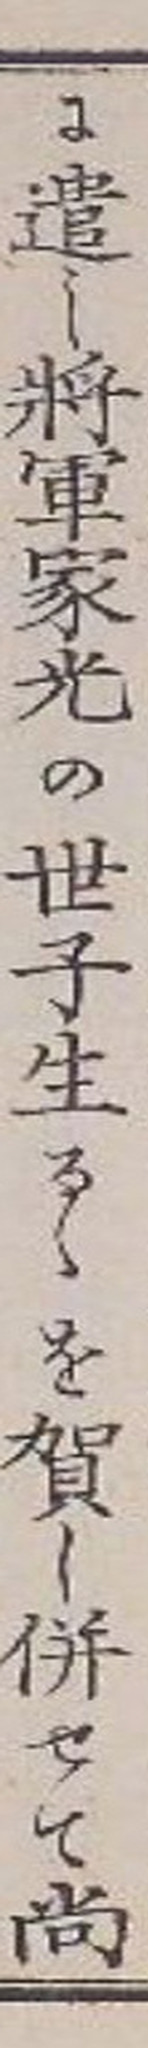に遣し将軍家光の世子生るゝを賀し併せて尚
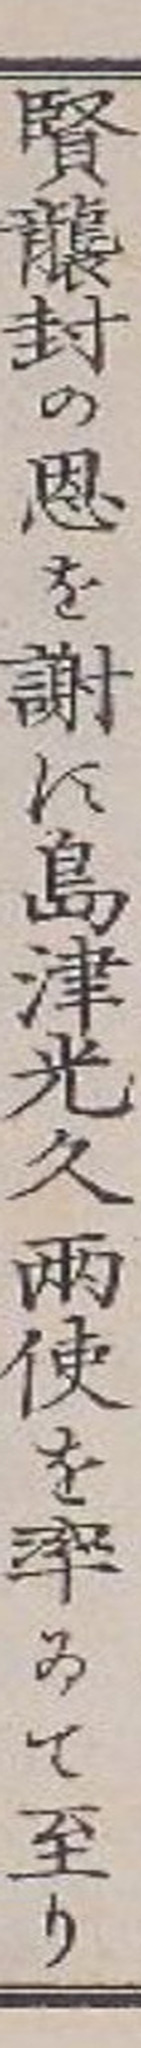賢龍封の恩を謝す島津光久両使を率ゐて至り
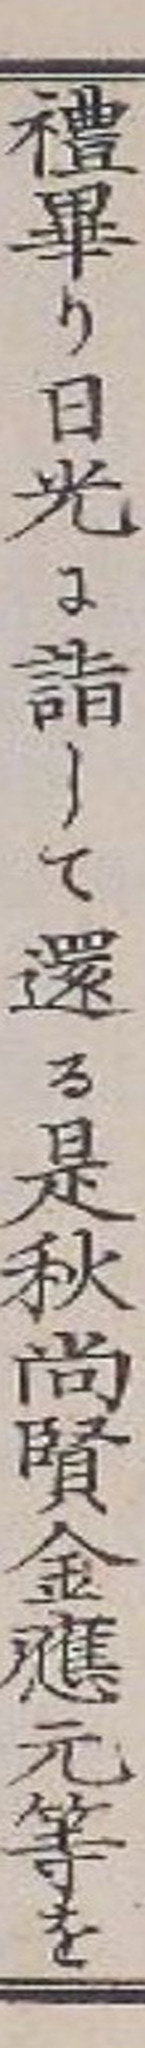礼畢り日光に詣して還る是秋尚賢金應元等を
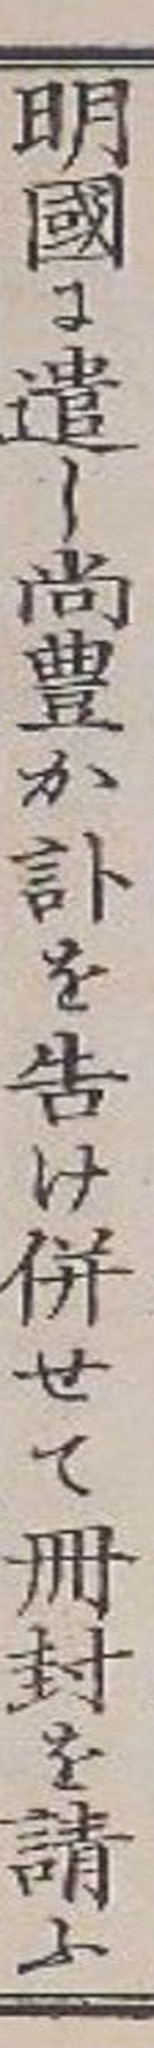明国に遣し尚豊か訃を告け併せて冊封を請ふ

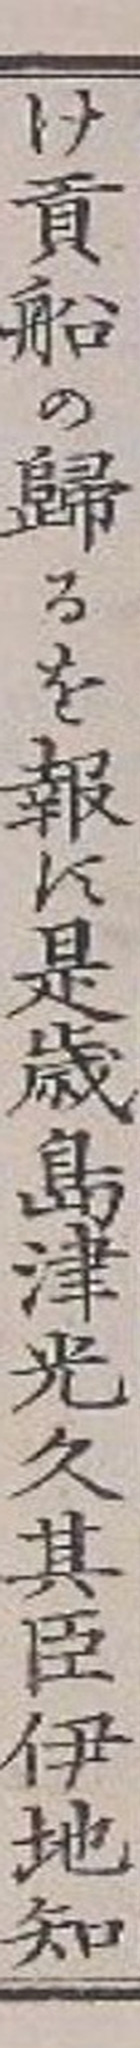け貢船の帰るを報す是歳島津光久其臣伊地知
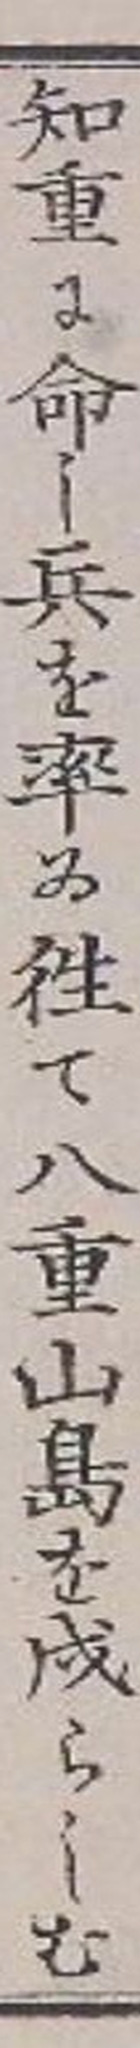知重に命し兵を率ゐ往て八重山島を成らしむ
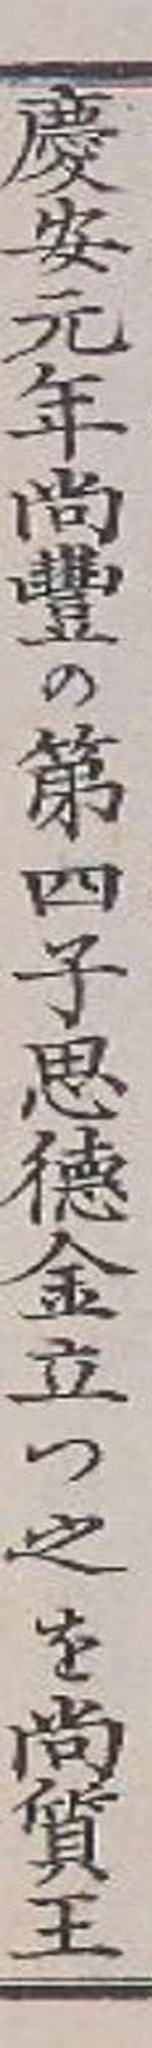慶安元年尚豊の第四子思徳金立つ之を尚質王
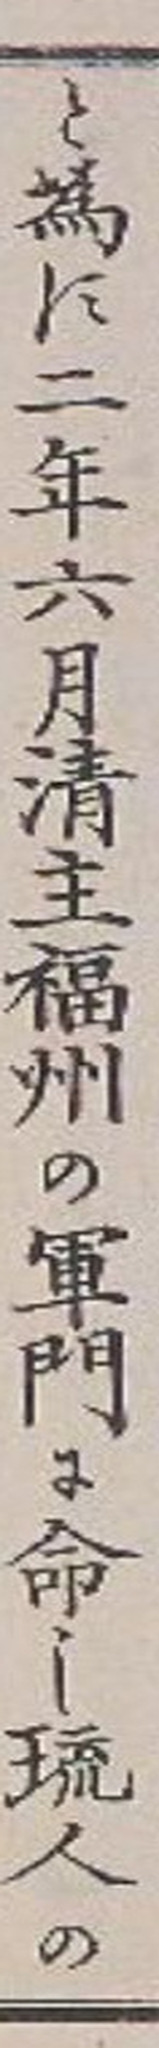と為す二年六月清主福州の軍門に命し琉人の
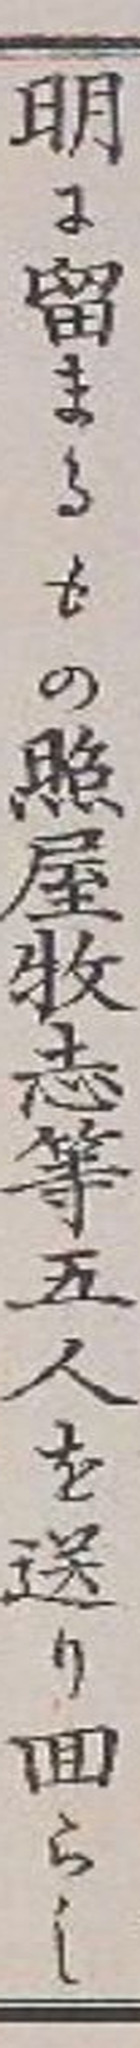明に留まるもの照屋牧志等五人を送り回らし
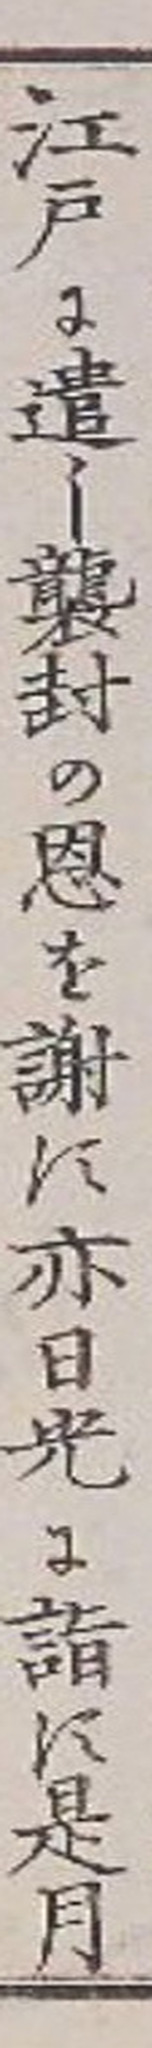江戸に遣し襲封の恩を謝す亦日光に詣す是月
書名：南島紀事 下
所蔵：University of the Ryukyus Library
